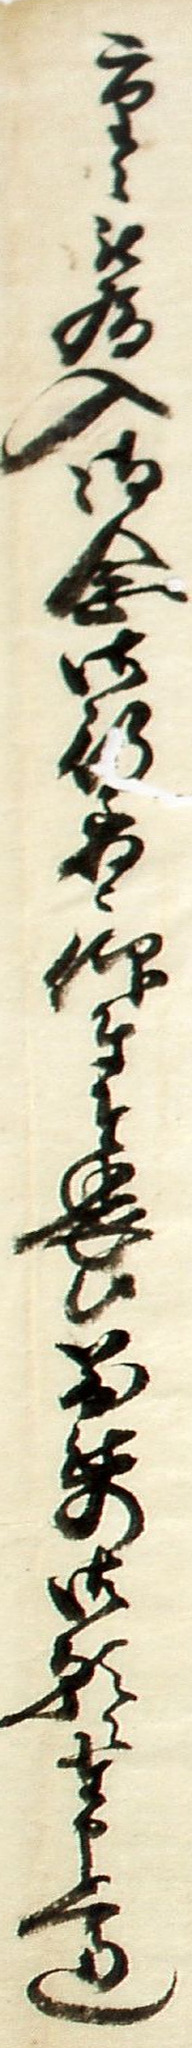重々被為入御念御行着被仰付奉畏候別帋御願ニ奉申上通
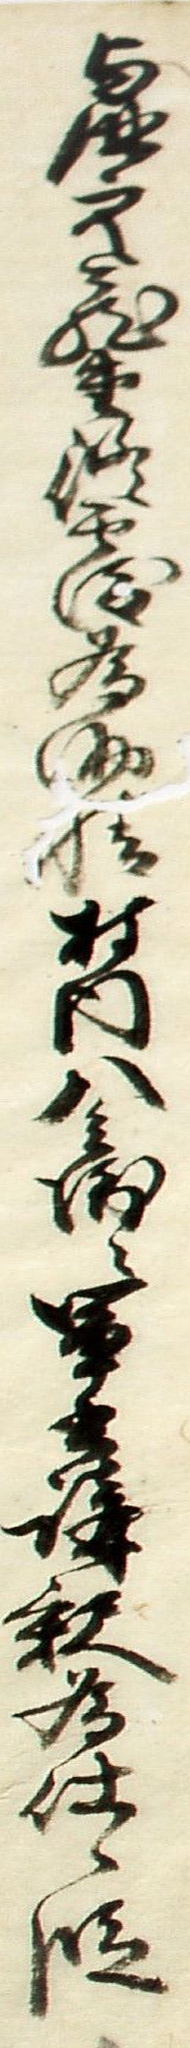虚空蔵堂修覆為助情村内八兵衛ニ軍書講釈為仕候段
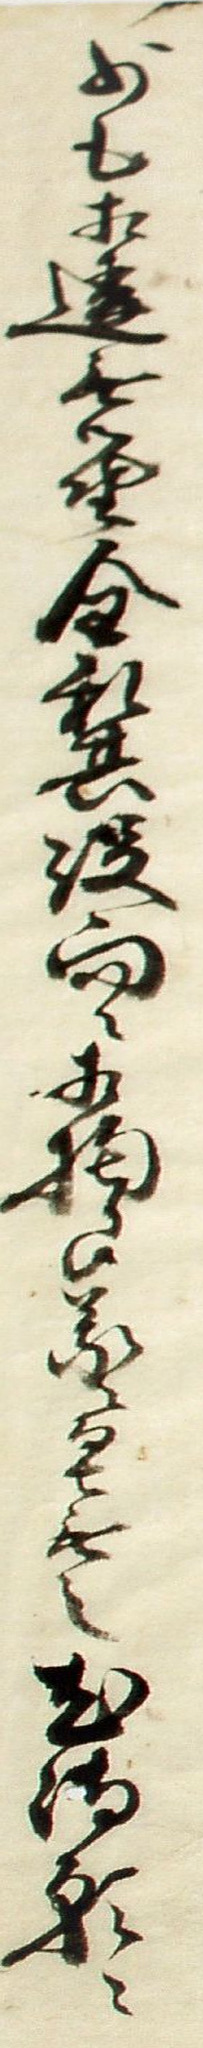少も相違無御坐全私共役向ニ相拘り候義ニ而者無之尤御願ニ
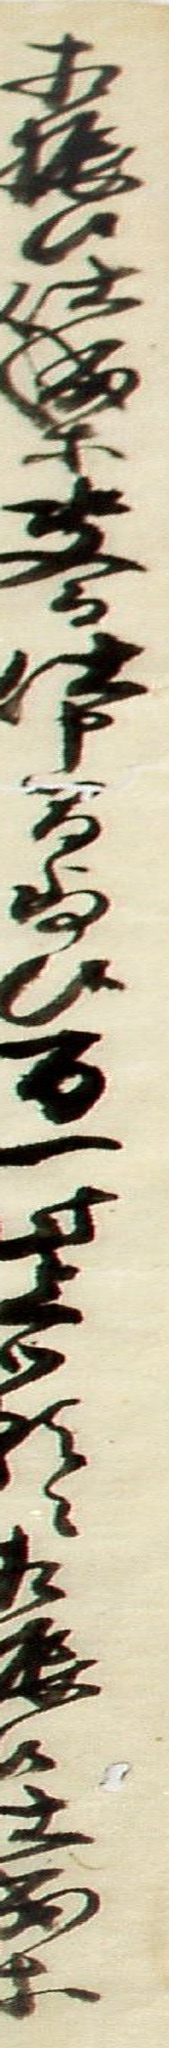相振候仕成等決而仕申間布候万一此上御願ニ相振候仕成等ただ

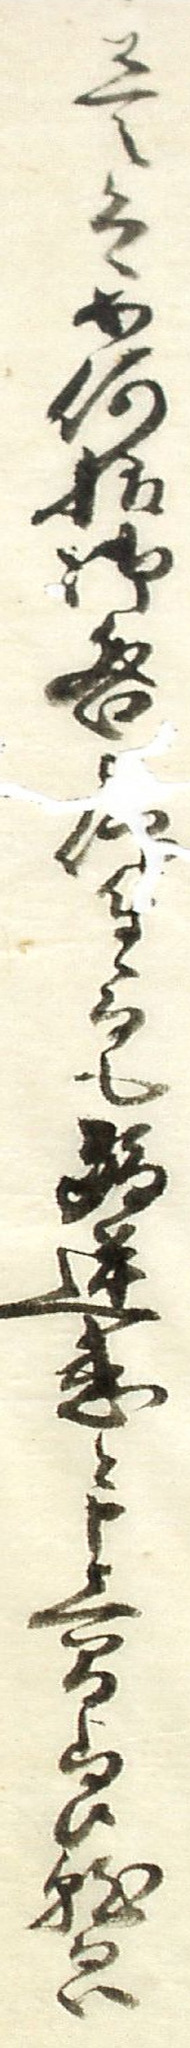有之候ハヽ如何様御咎被仰付候而も聊迷惑と申上間布候就而ハ
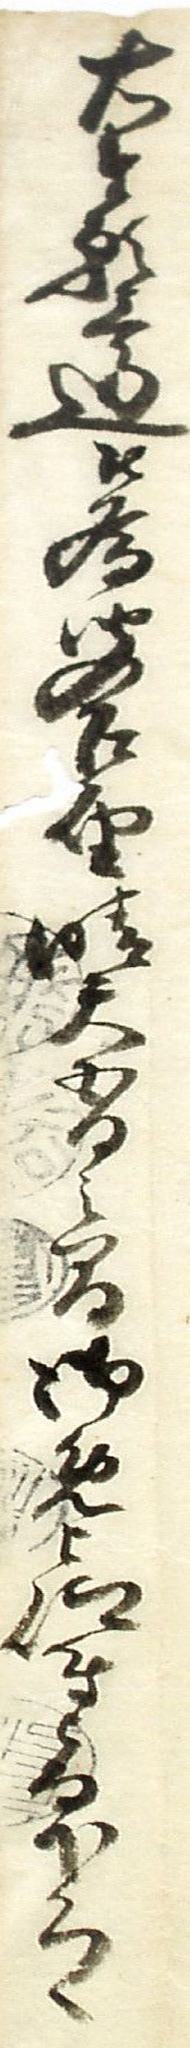右奉願上通被為聞召届晴天五日之間御免被仰付被為下候ハヽ
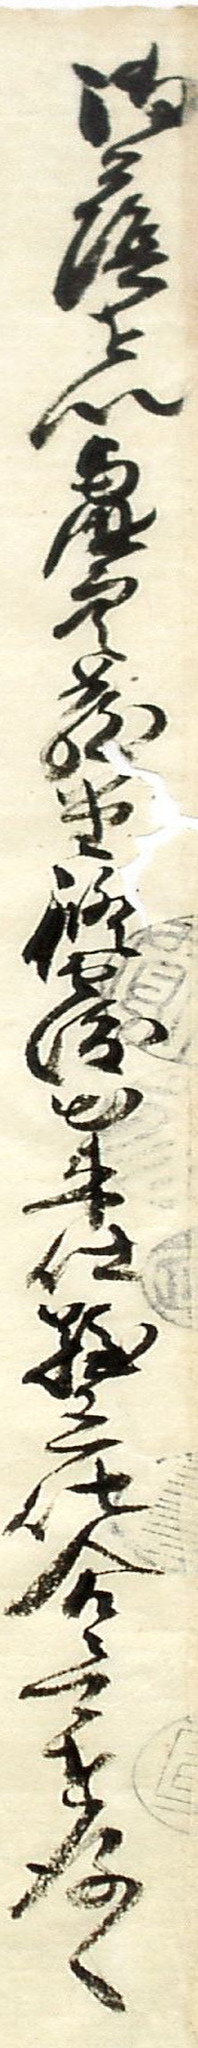御蔭を以虚空蔵堂修覆出来仕難有仕合ニ可奉存候
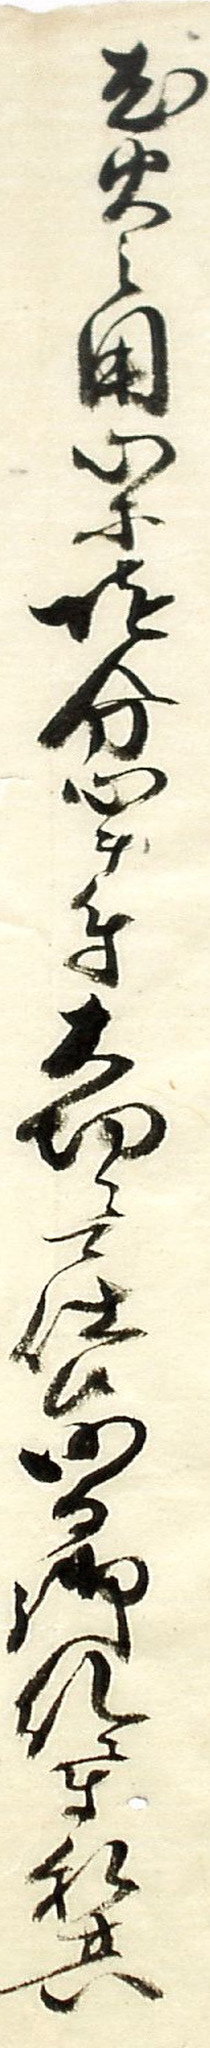尤も火之用心等随分心ヲ付大切ニ可仕候仍而御糺ニ付私共
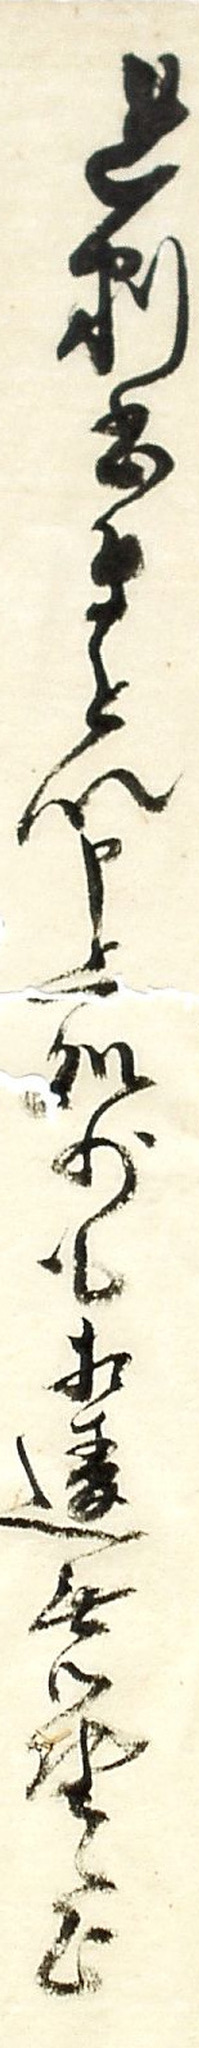連判書付を以申上処少も相違無御坐候以上
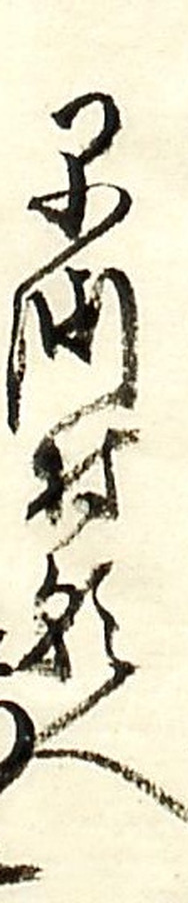早渕村願人
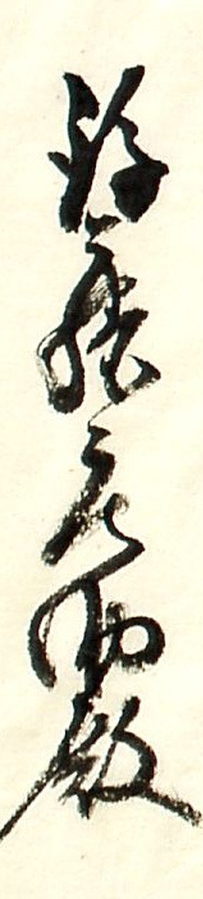後藤庄助殿
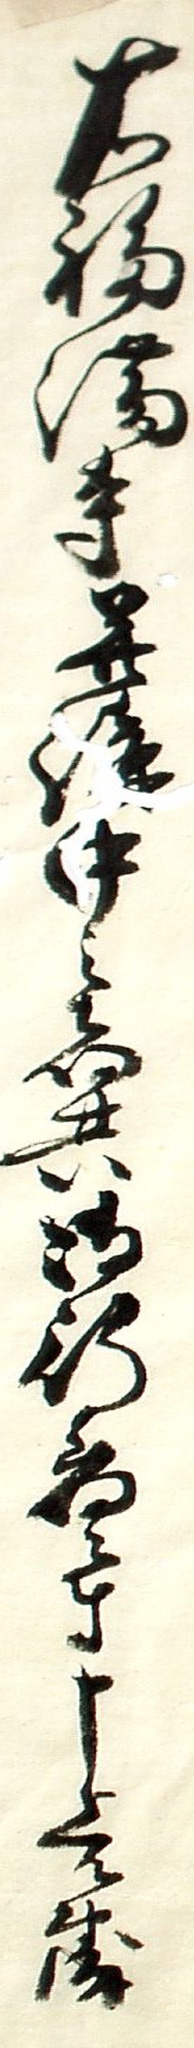右福満寺幷講中之者共御行着ニ付申上ル處
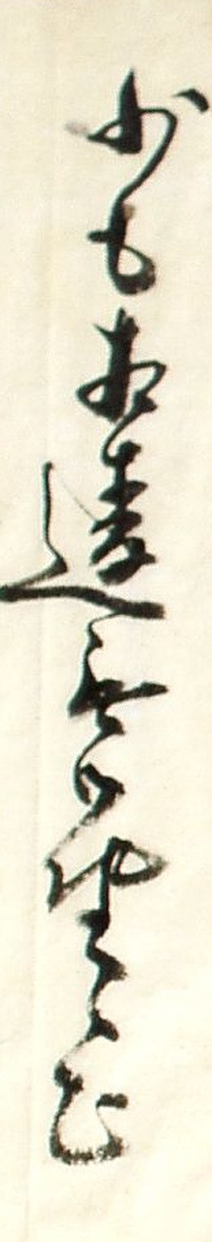少も相違無御坐候以上
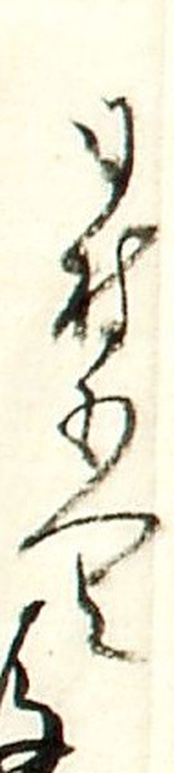同村五人与
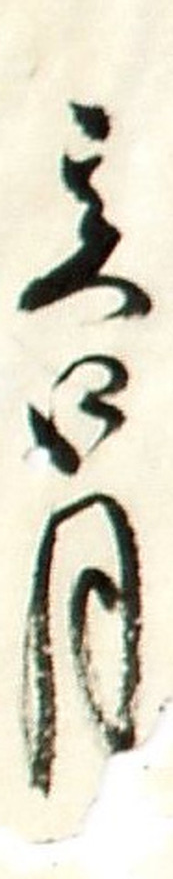亥四月
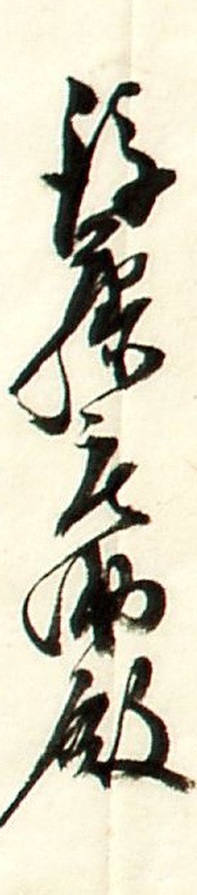後藤庄助殿
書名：(早渕村福満寺子供浄瑠璃願書）他
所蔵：鳴門教育大学 Naruto University of Education
